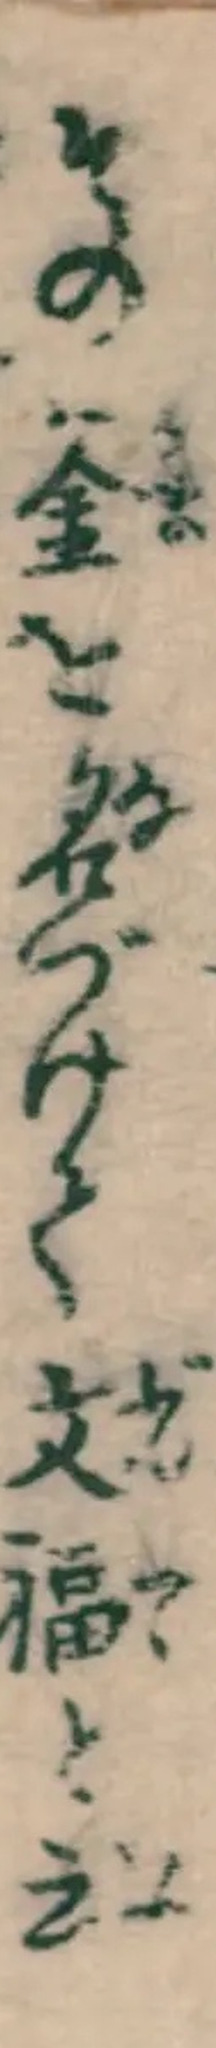その釜を名づけて文福と云
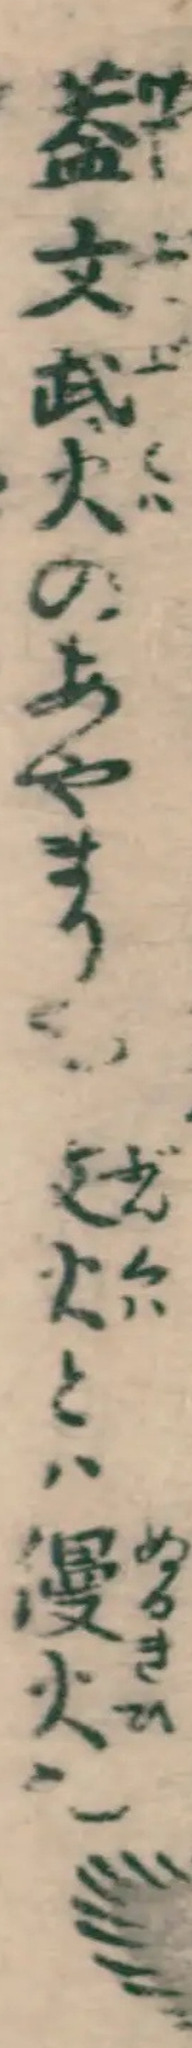蓋文武火のあやまり也文火とは慢火也
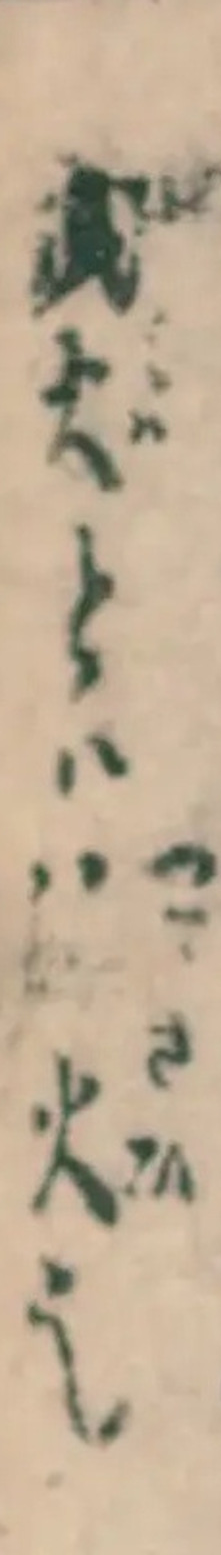武火とは活火也

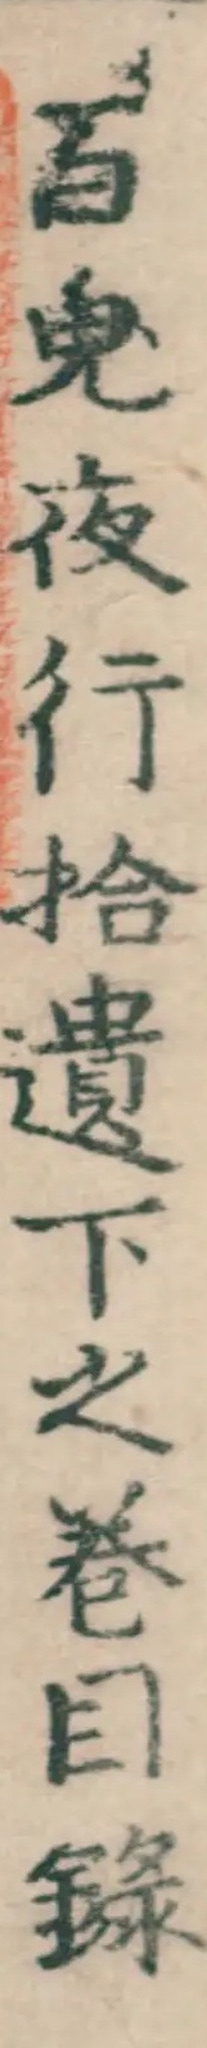百鬼夜行拾遺下之巻目録
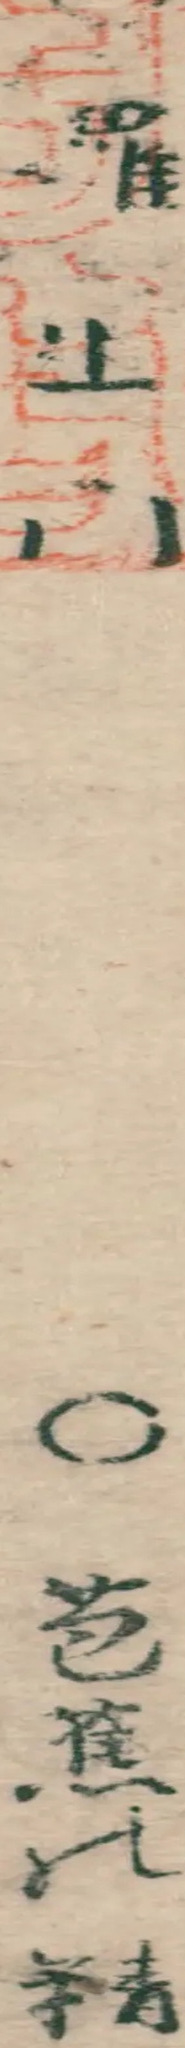○羅生門○芭蕉の精
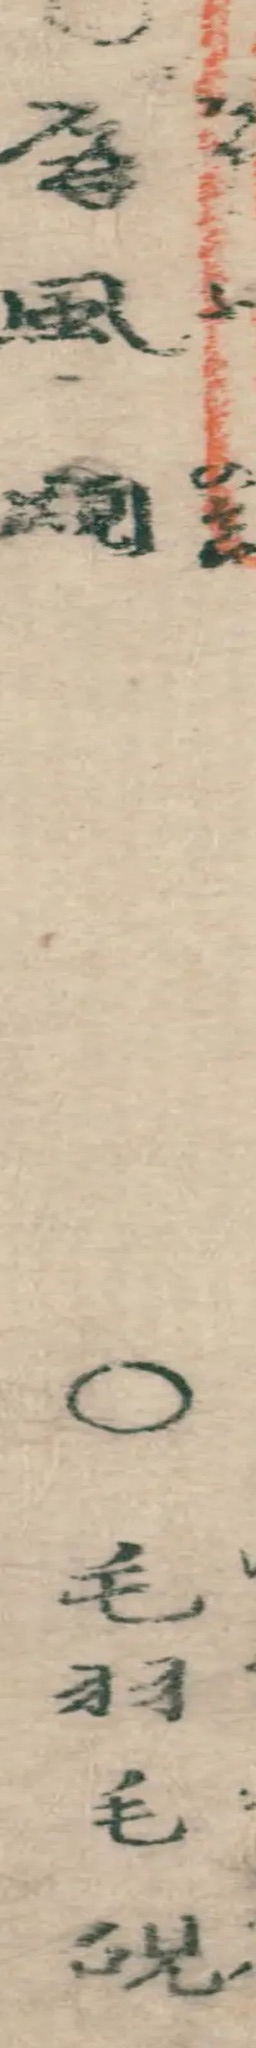○屏風闚○毛羽毛現

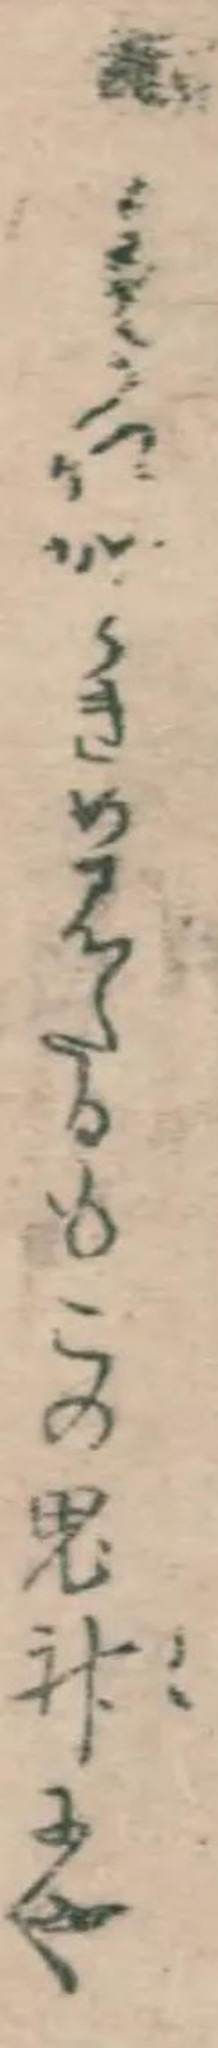腕をきられからきめ見たるもこの鬼神にや
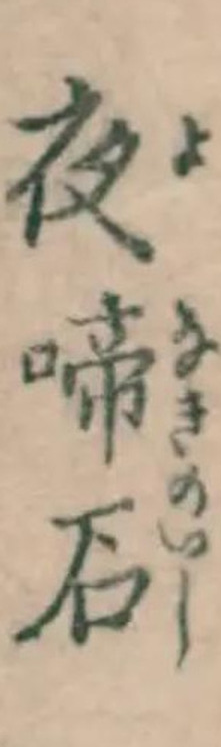夜啼石
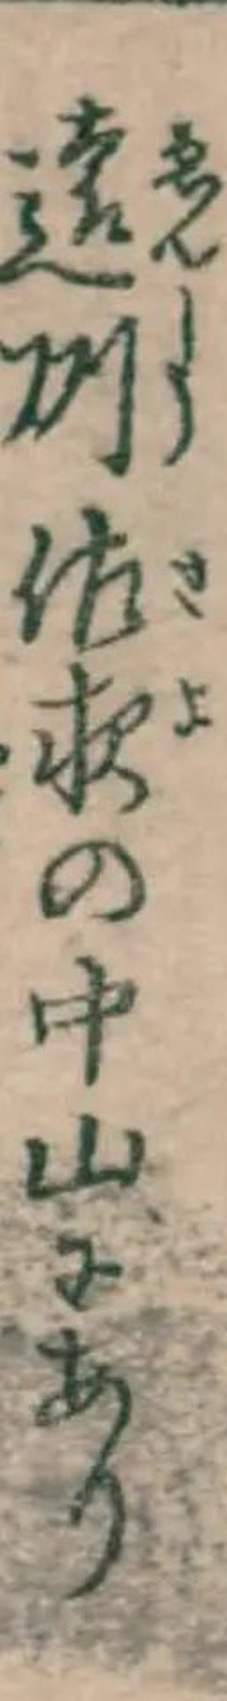遠州佐夜の中山にあり
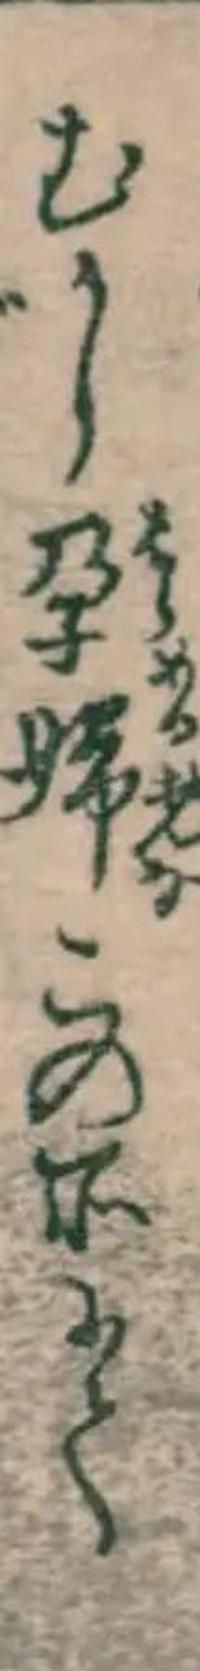むかし孕婦この所にて
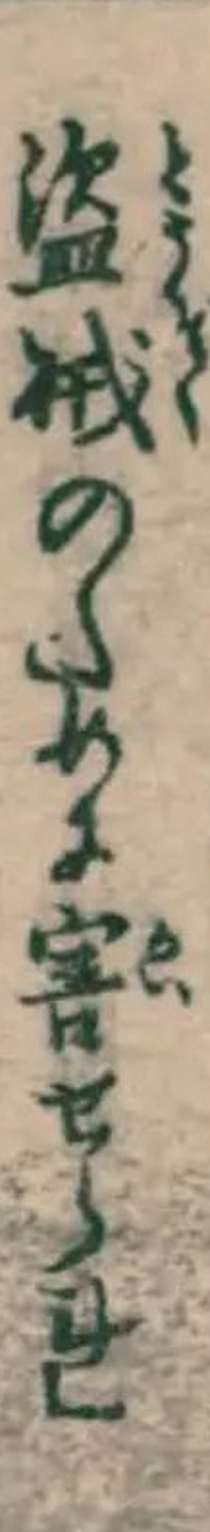盗賊のために害せられ
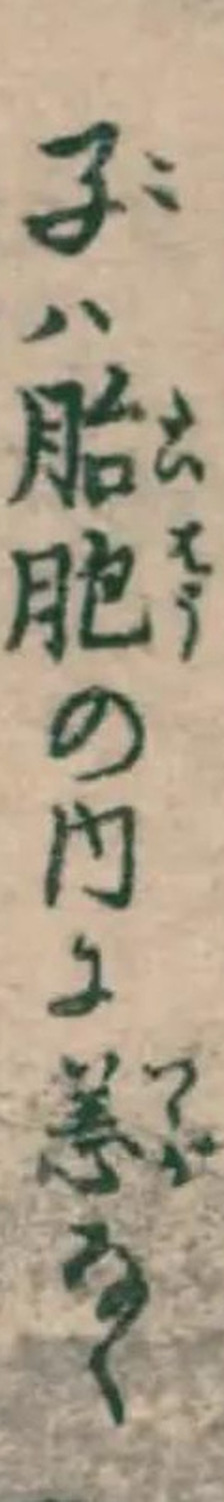子は胎胞の内に恙なく
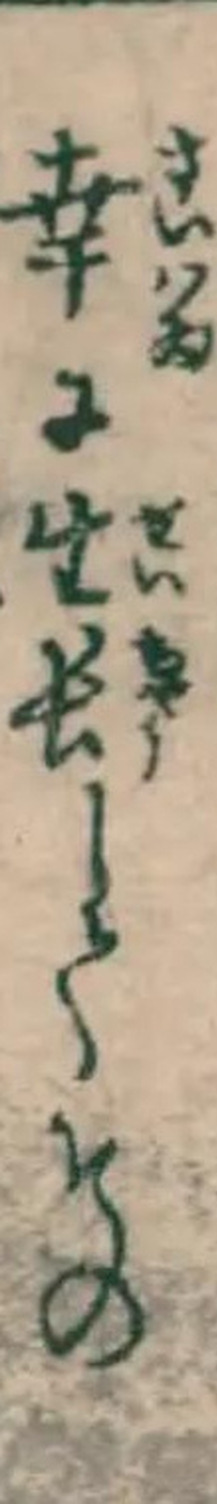幸に生長してその
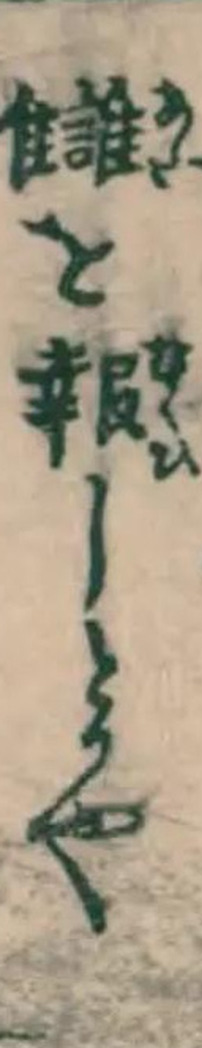讐を報しとかや

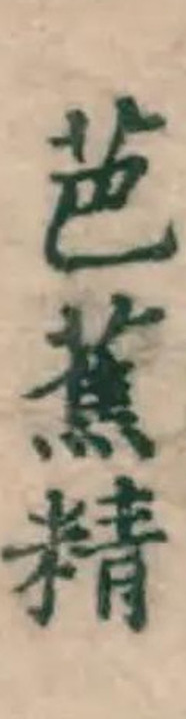芭蕉精
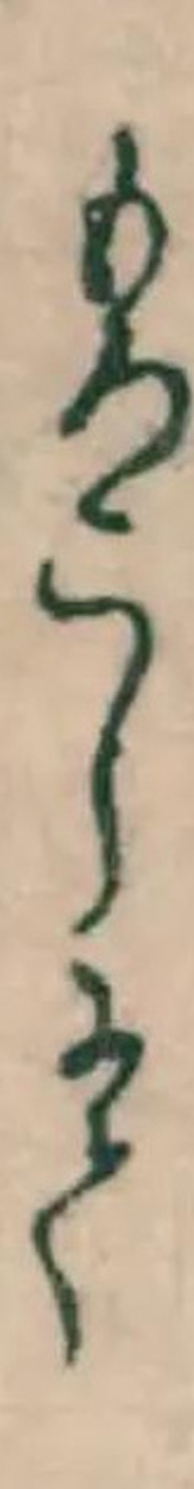もろこしにて
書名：百鬼夜行 3巻拾遺3巻. [2]
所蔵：国立国会図書館 National Diet Library, JAPAN
